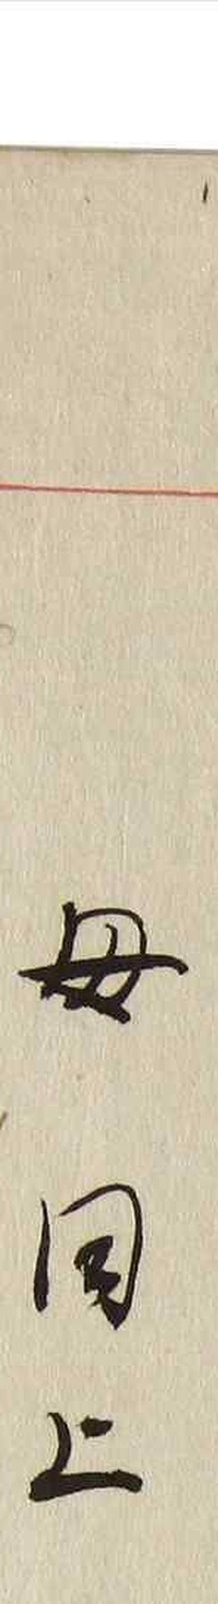母同上
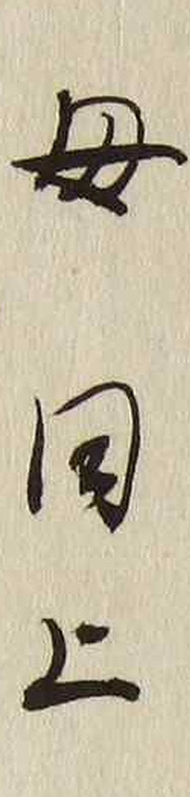母同上

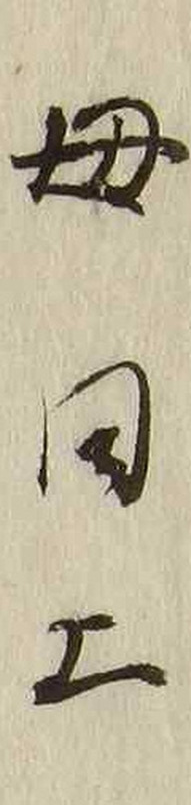母同上

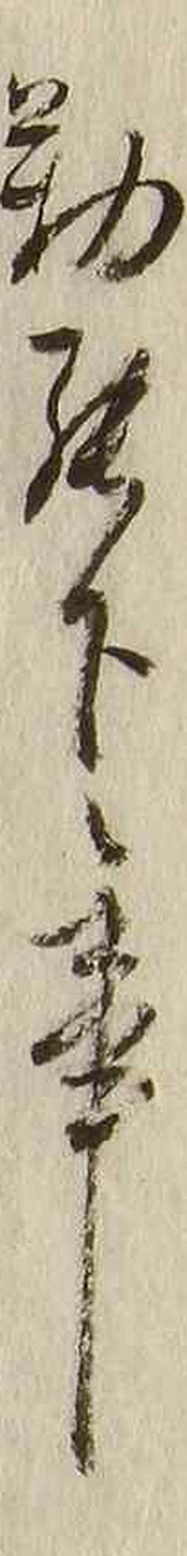勤罷下候事
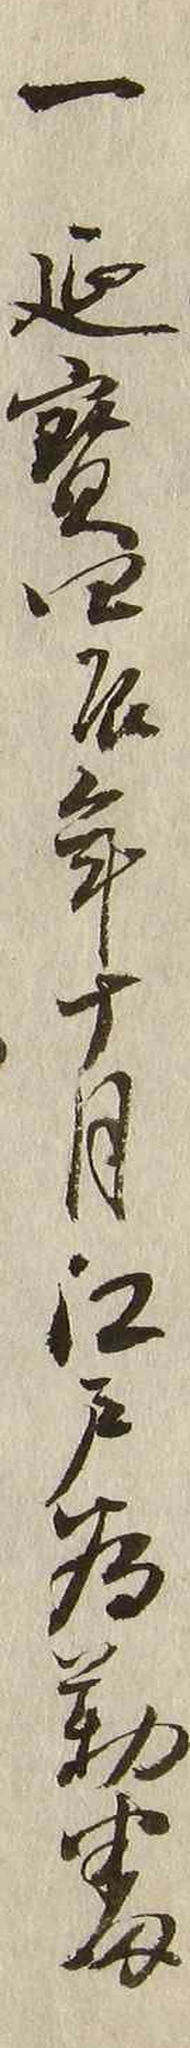一延宝四辰年十月江戸為勤番
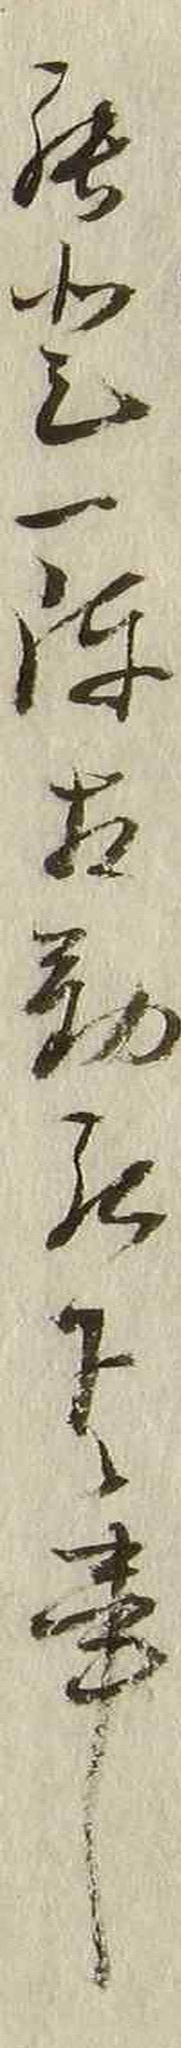罷登一陣相勤罷下候事
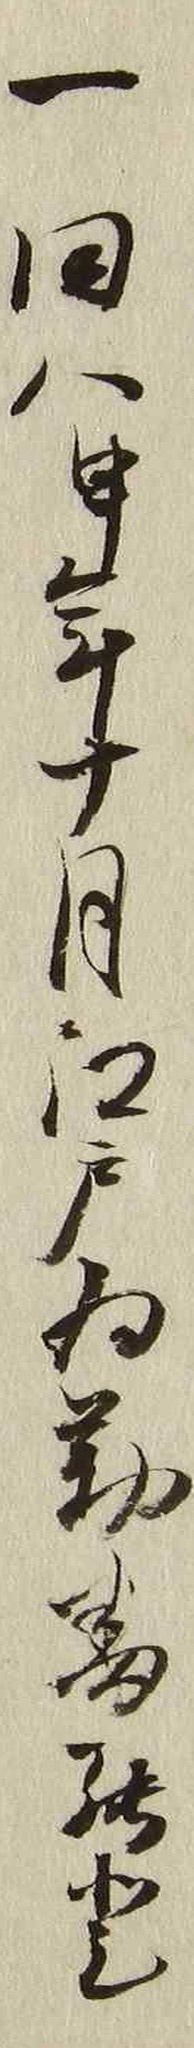一同八申年十月江戸為勤番罷登
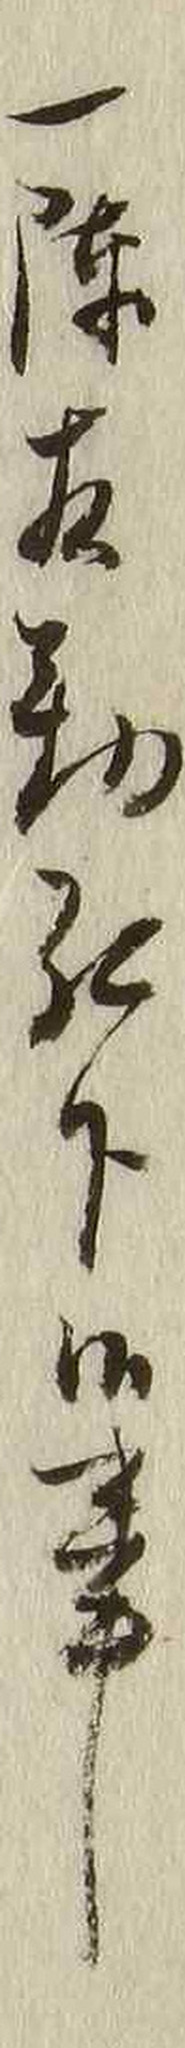一陣相勤罷下候事
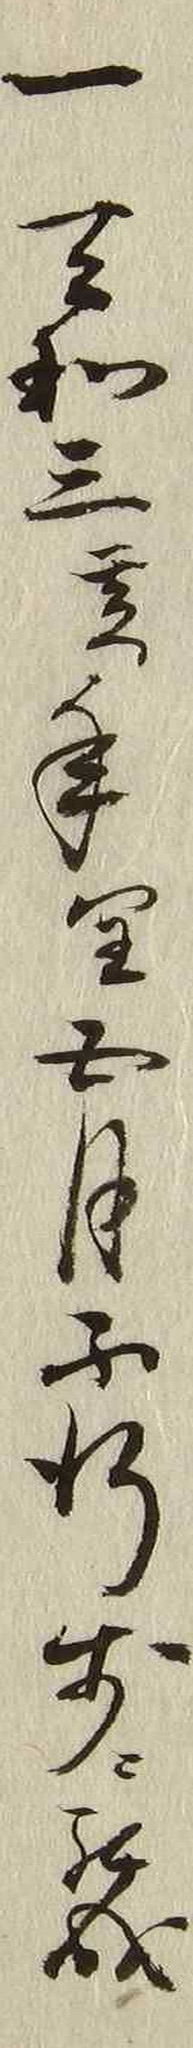一天和三亥年閏五月不行歩ニ罷成
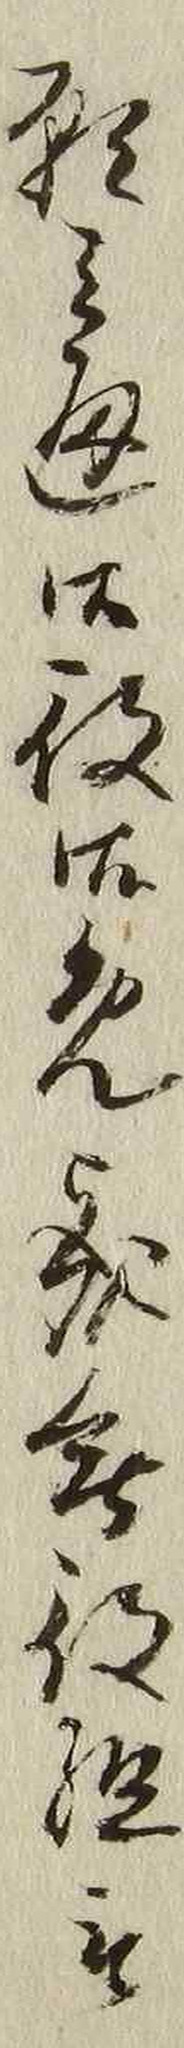願之通御役御免被成無役組被
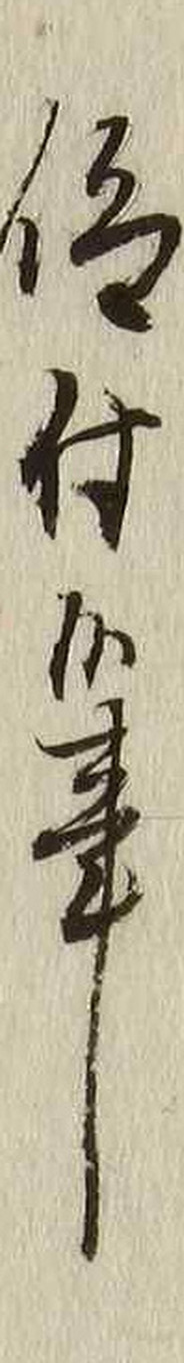仰付候事
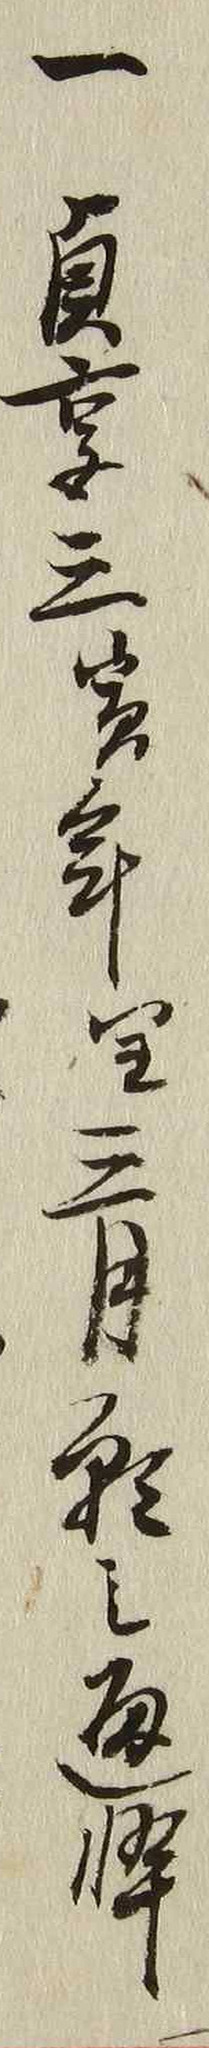一貞享三寅年閏三月願之通忰
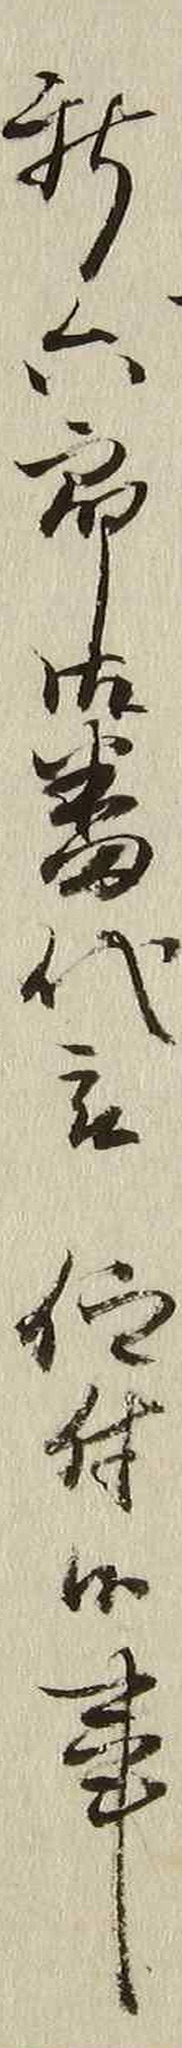新六郎御番代被仰付候事
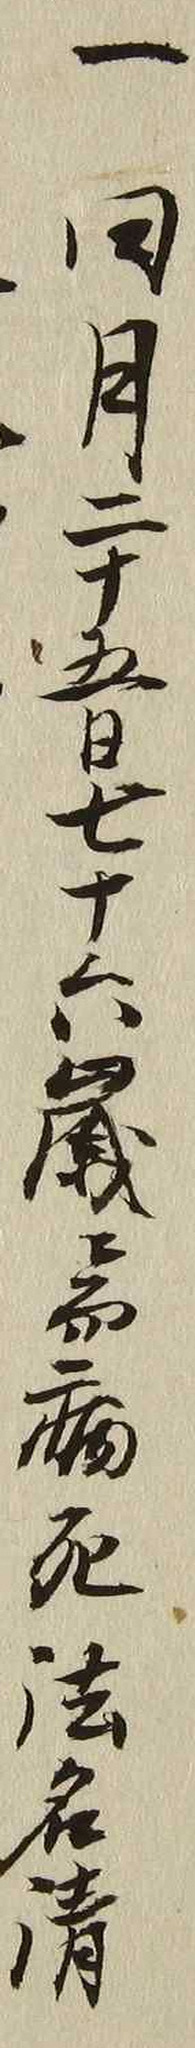一同月二十五日七十六歳ニ而病死法名清
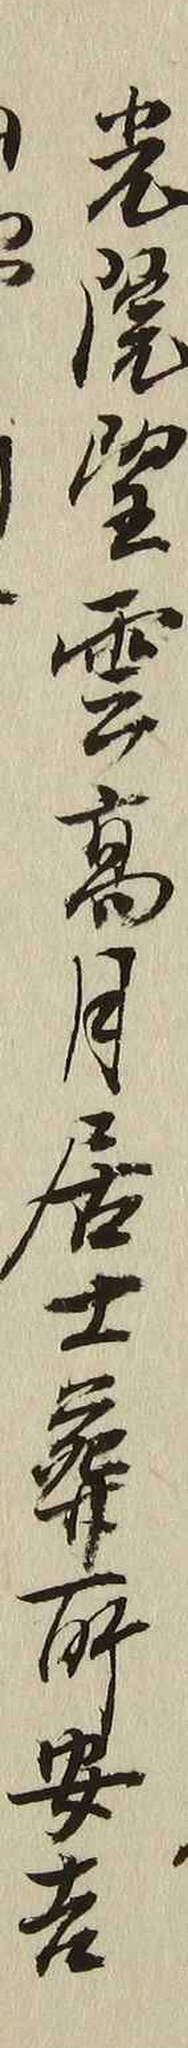光院望雲高月居士葬所安吉
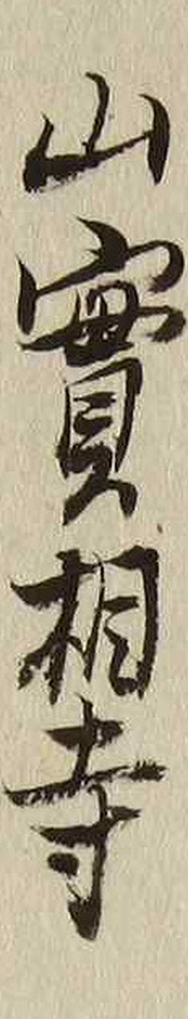山実相寺
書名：諸士系譜　巻之348　も之部4
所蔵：会津若松市立会津図書館
